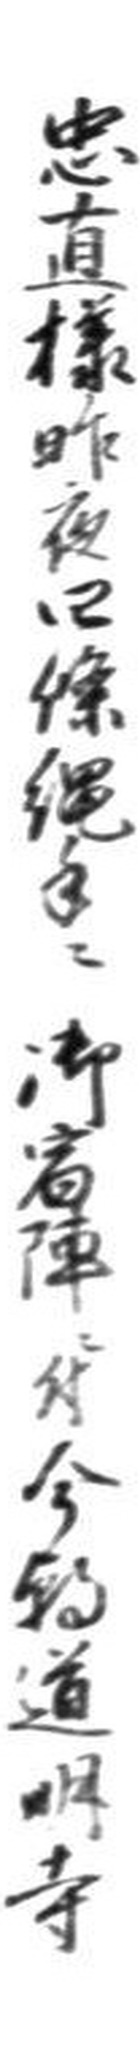忠直様昨夜四條縄手ニ御宿陣ニ付今朝道明寺
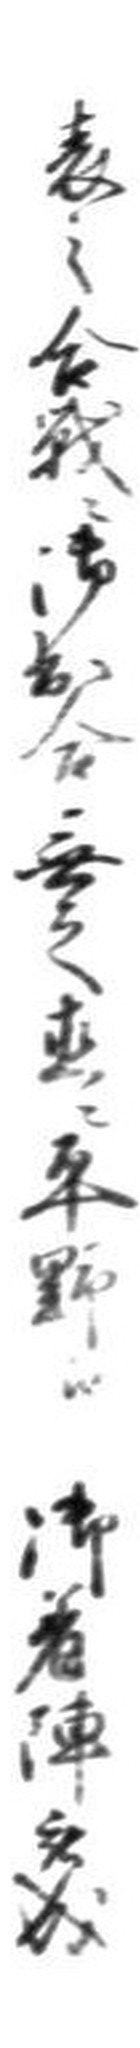表之合戦ニ御出合無之直ニ平野江御着陣被成
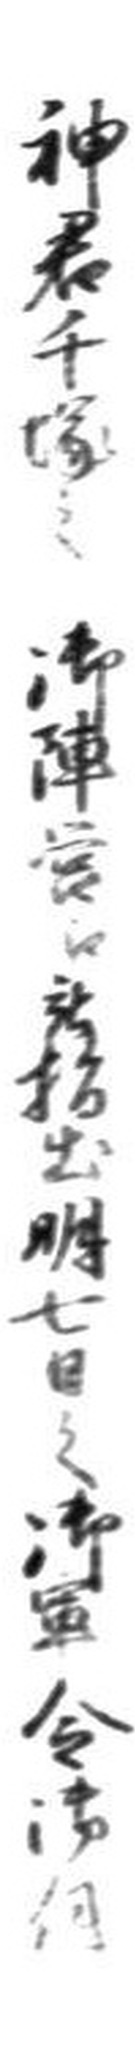神君千塚之御陣営江被指出明七日之御軍令御伺
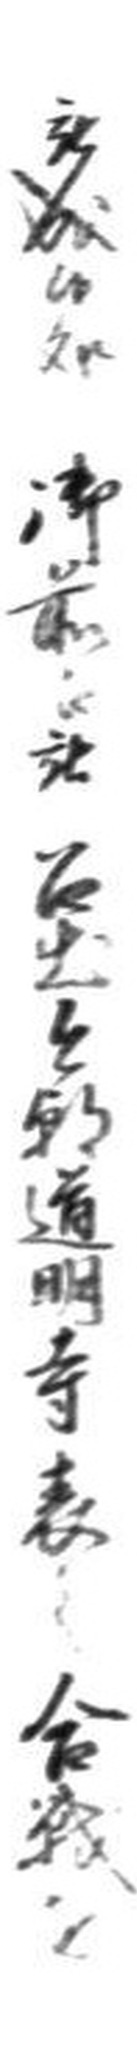被成候処御前江被召出今朝道明寺表之合戦を
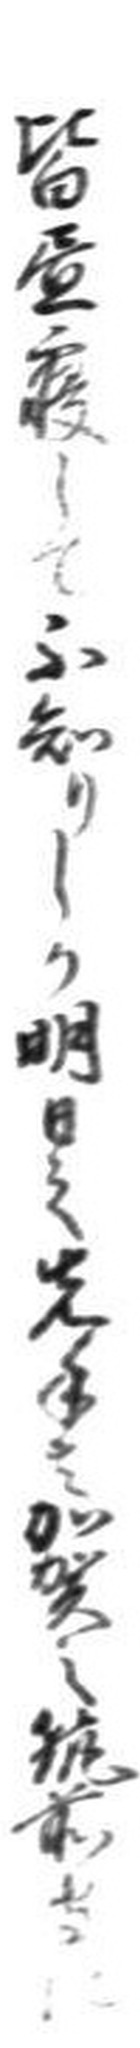皆昼寝して不知りしか明日之先手者加賀之筑前守
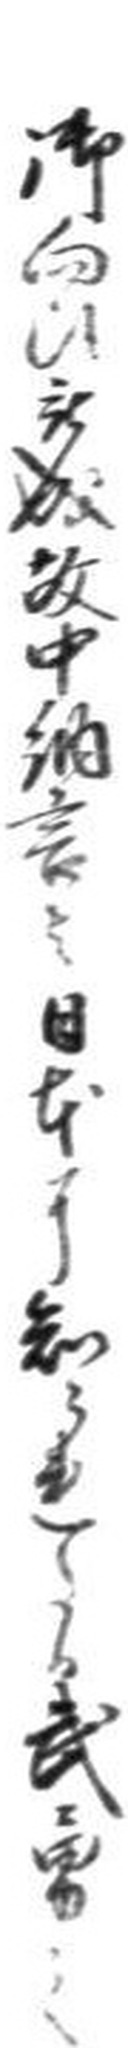御向ひ被成故中納言者日本に知られたる武勇之

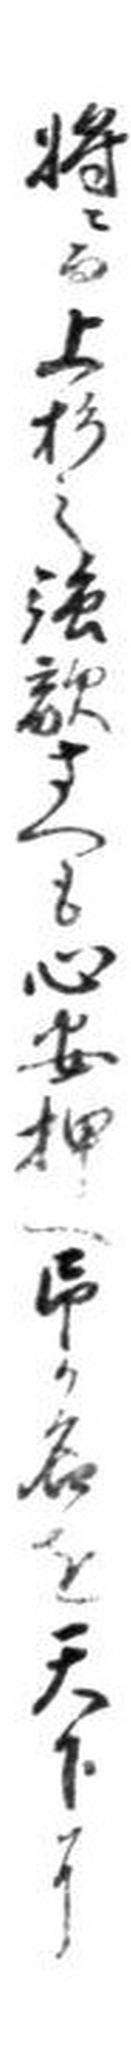将ニ而上杉之強敵さへも心安押へか名を天下に
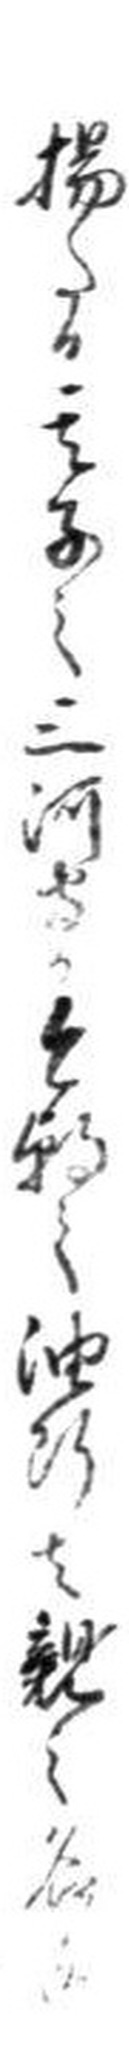揚たる其子之三河守か今朝之油断者親之名を
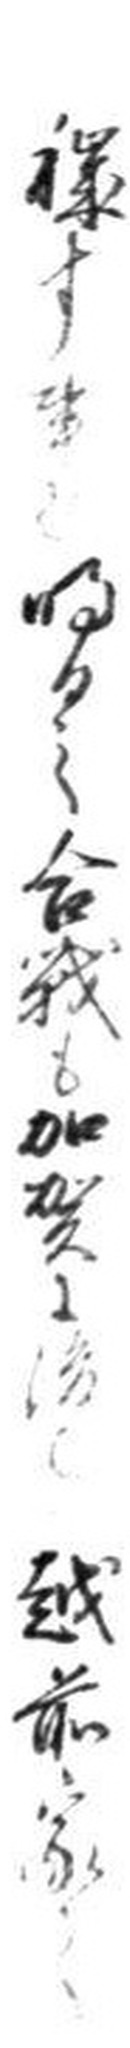穢す事也明日之合戦も加賀に後て越前家之
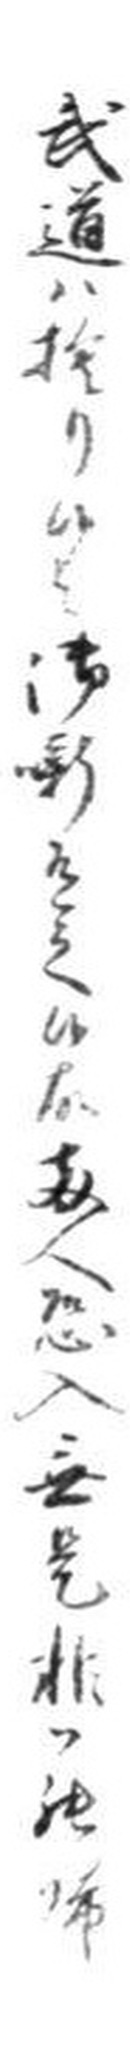武道ハ捨り候与御噺有之候故両人恐入無是非罷帰
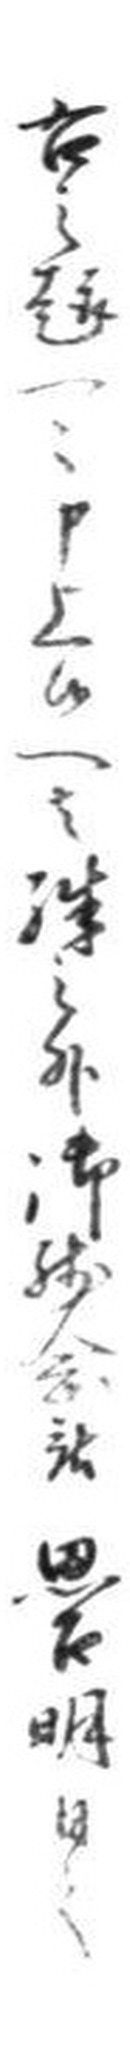右之趣一々申上候へ者殊之外御残念被思召明日之
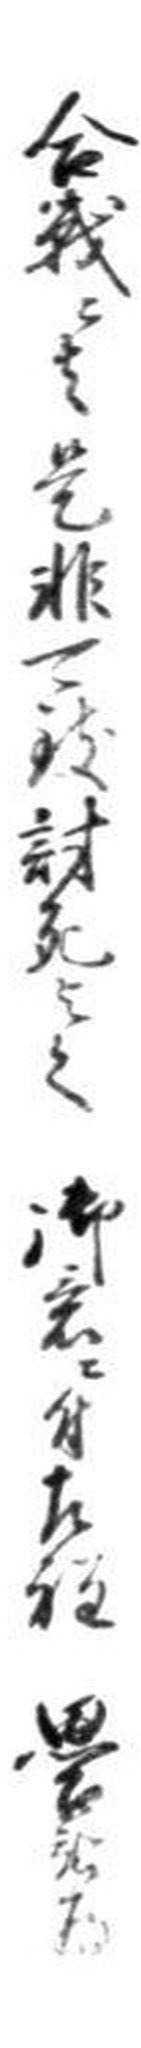合戦ニ者是非可致討死与之御意ニ付左程思召被為
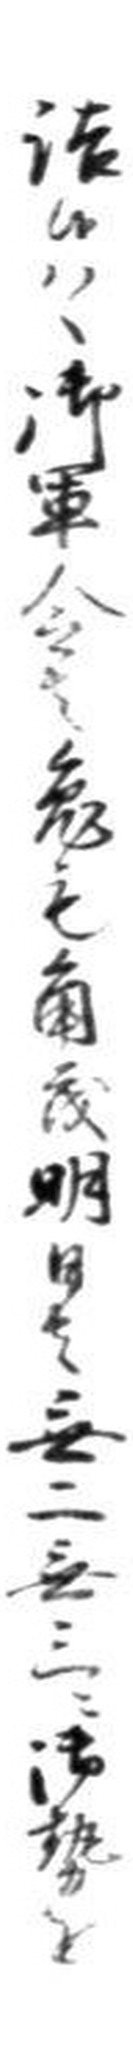詰候ハヽ御軍令者兎も角茂明日者無二無三ニ御勢を
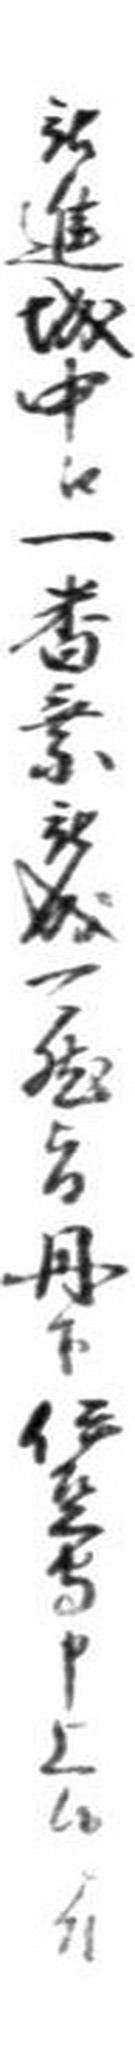被進城中江一番乗被成可然旨丹下伊豆守申上候ニ付
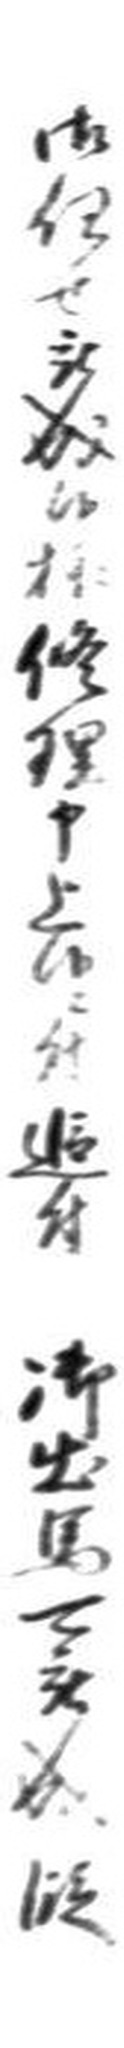御任せ被成候様修理申上候ニ付追付御出馬可被成段
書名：家譜 二 忠直公 従文禄四年到慶安四年
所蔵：福井県文書館 Fukui Prefectural Archives
